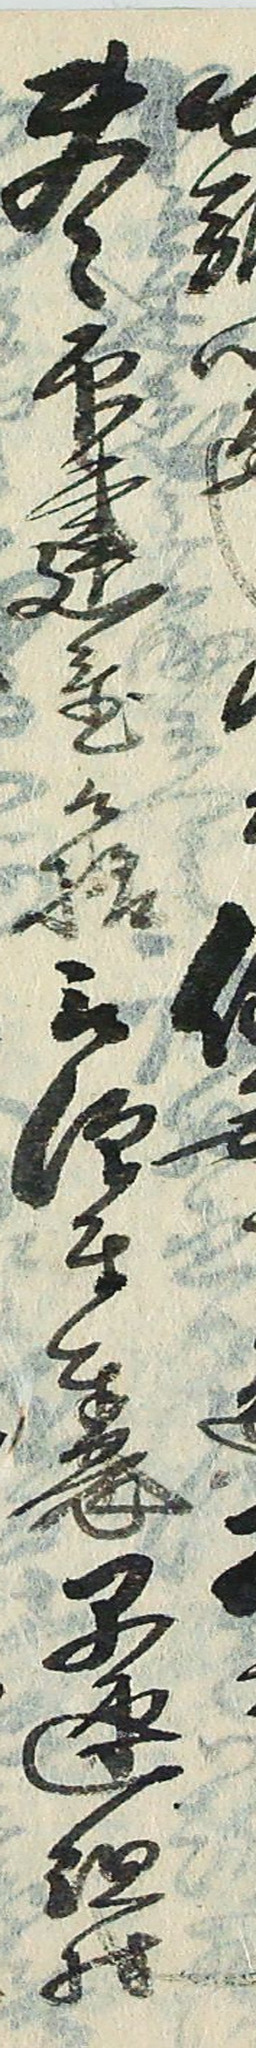夫々印建置候様被仰付奉畏早速組村
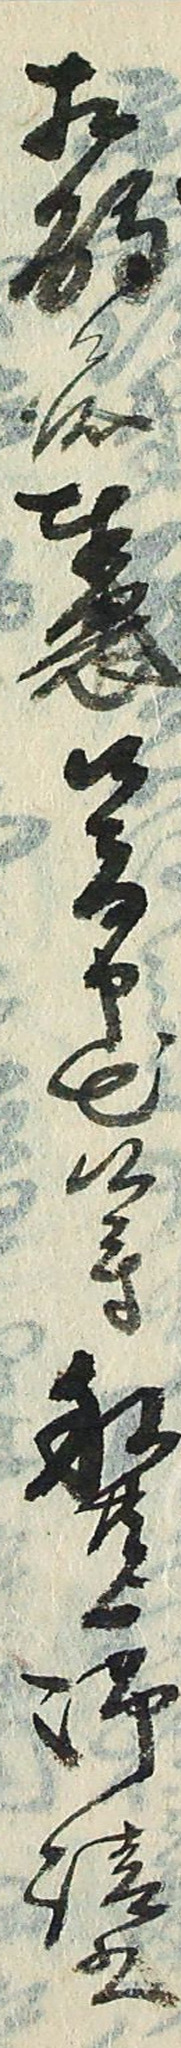相触候所奉畏候旨申出候に付私共ゟ御請書
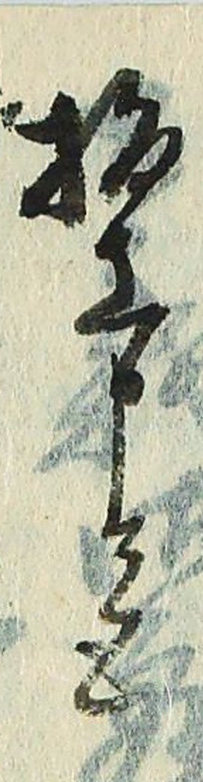指上申候以上
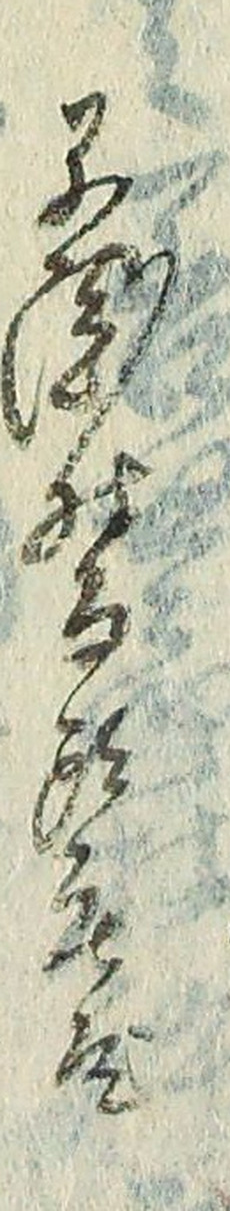早淵村与頭庄屋
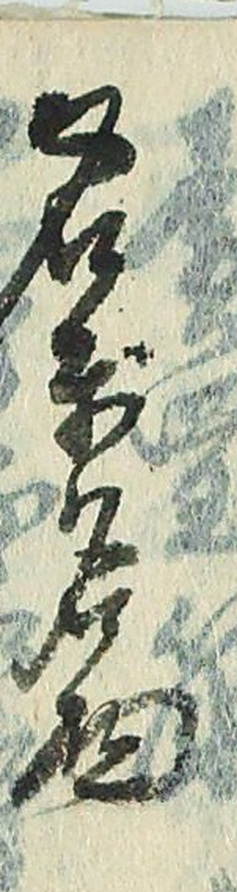名東名西
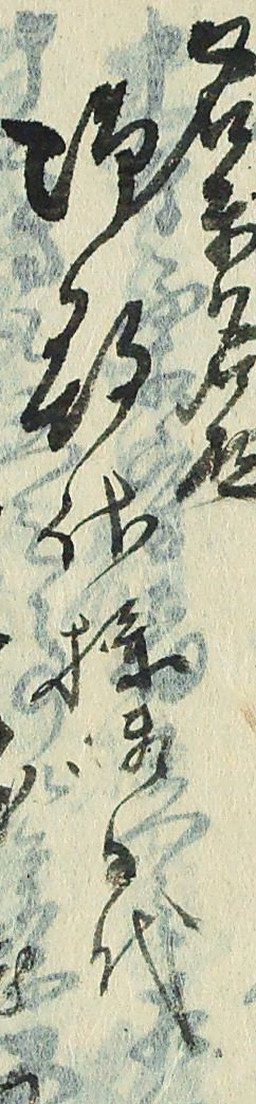御郡代様御手代
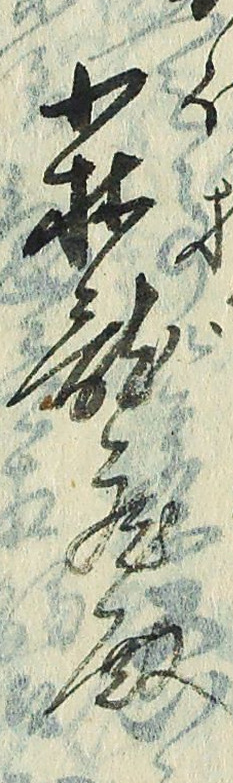小林龍蔵殿
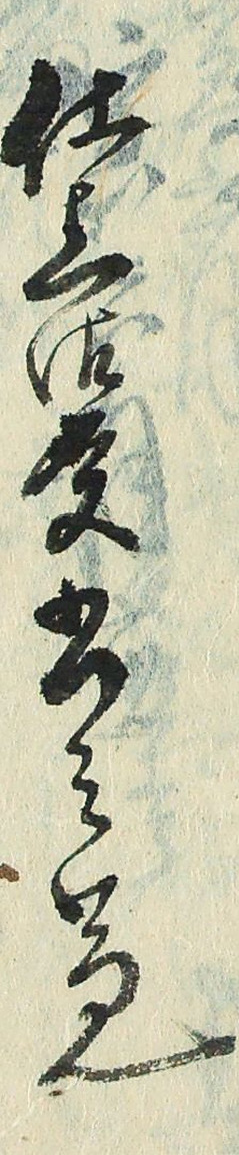仕上御請書之覚
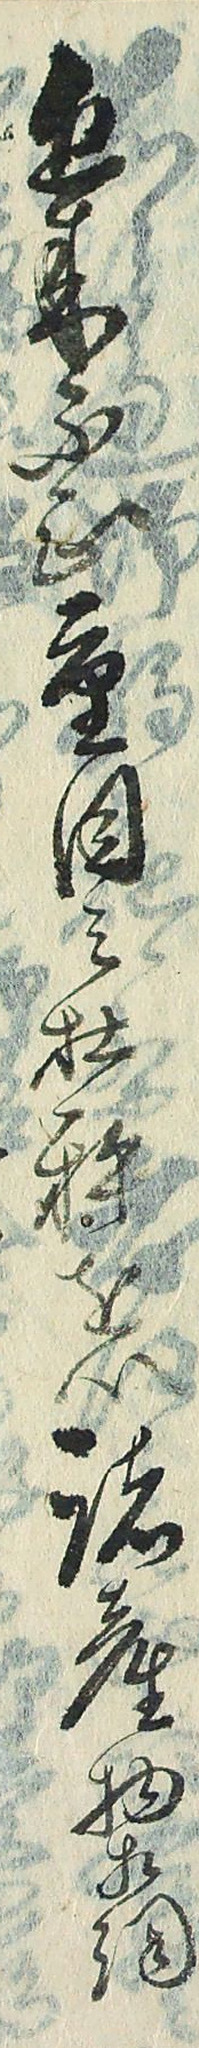近来不正重目之杜秤を以諸産物相調
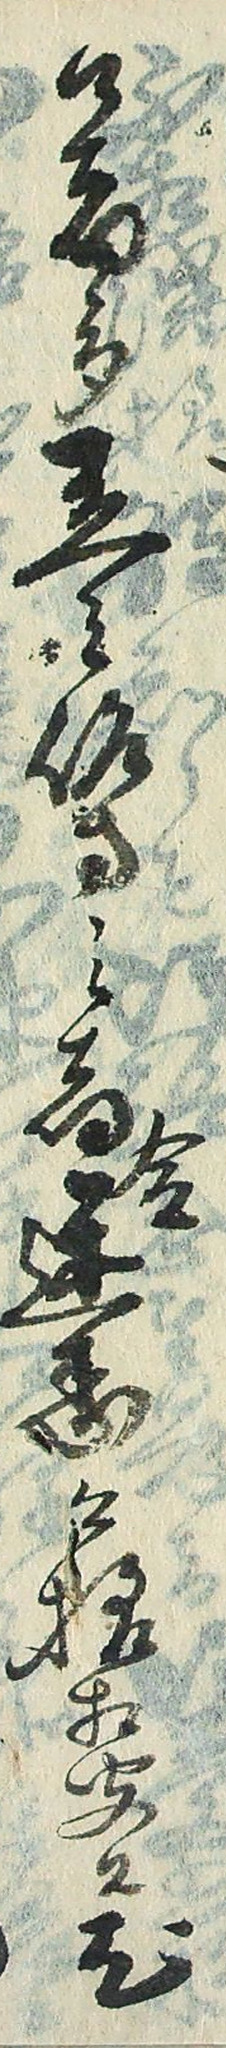候者多有之作方之者令迷惑候様相聞候尤
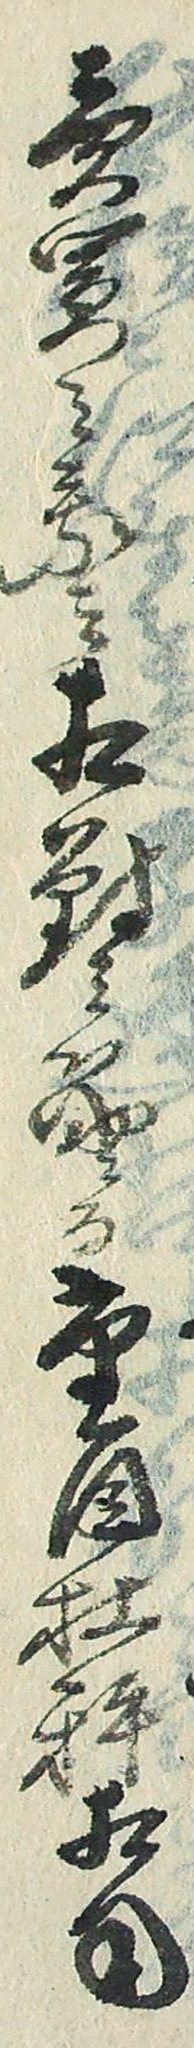売買之義は相對の筋にて重目杜秤相用

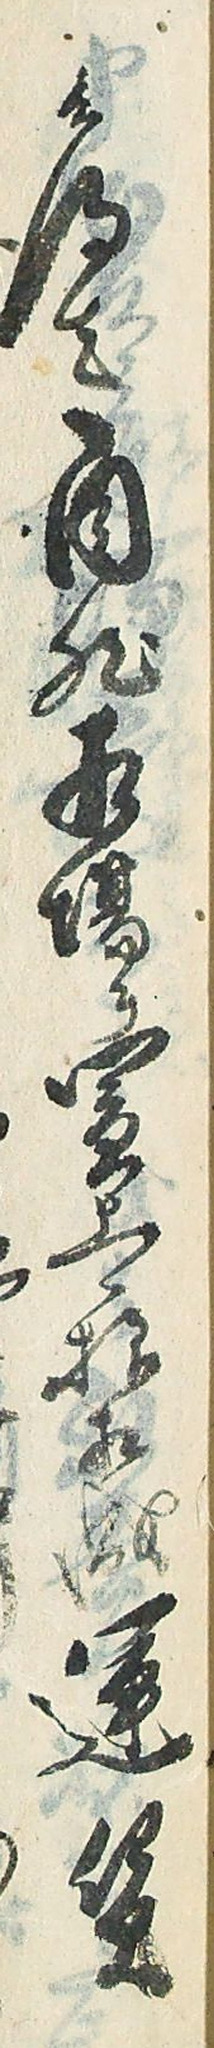候得者自然相場を買上候様相成運賃
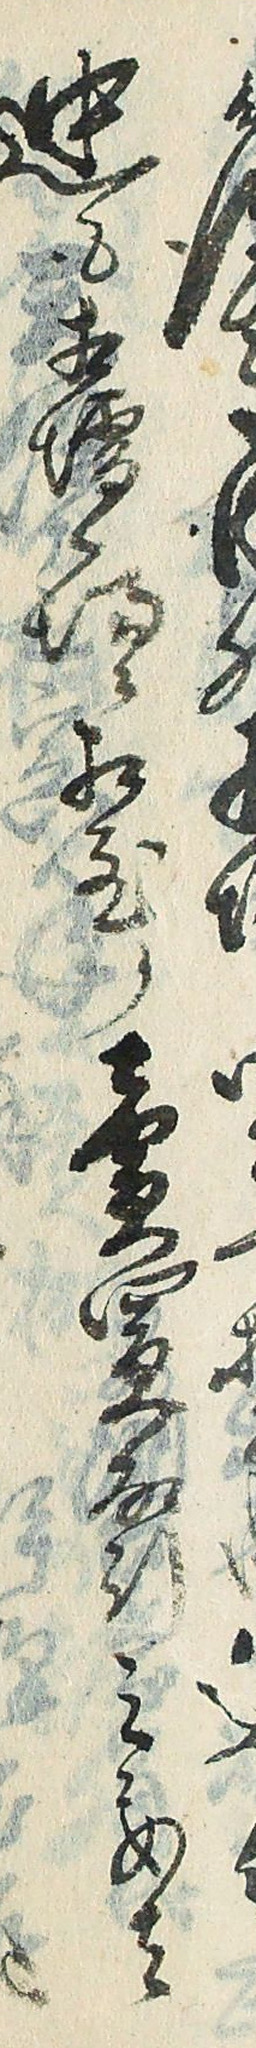迚も相増候場に相至り売買取引之義は
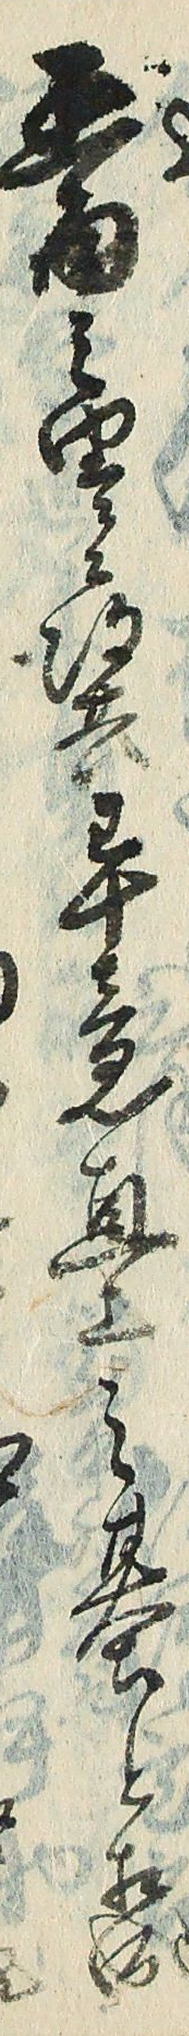互角之由に候得共畢竟直上之基と相成
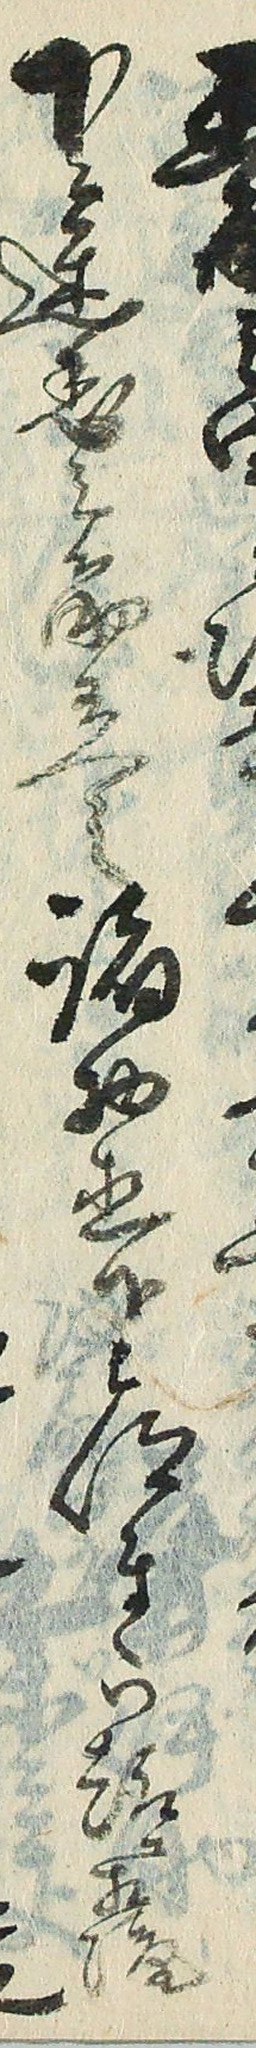下々迷惑之筋有之諸物直下被仰付候御趣に相障
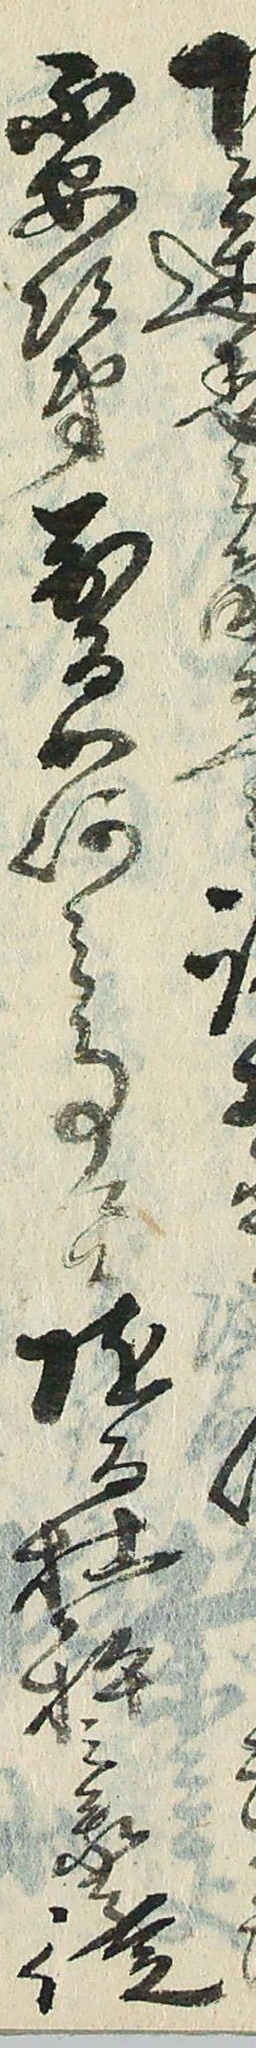不安次第別而如何之事に候随而杜秤之義は従
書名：諸御用御□受書控
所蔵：鳴門教育大学 Naruto University of Education
